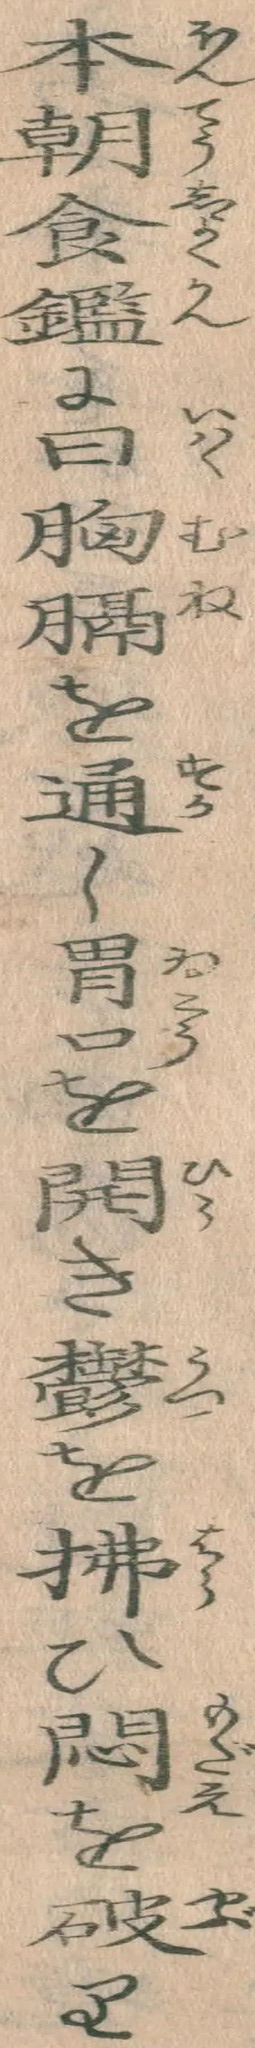本朝食鑑に曰胸膈を通し胃口を開き鬱を払ひ悶を破り
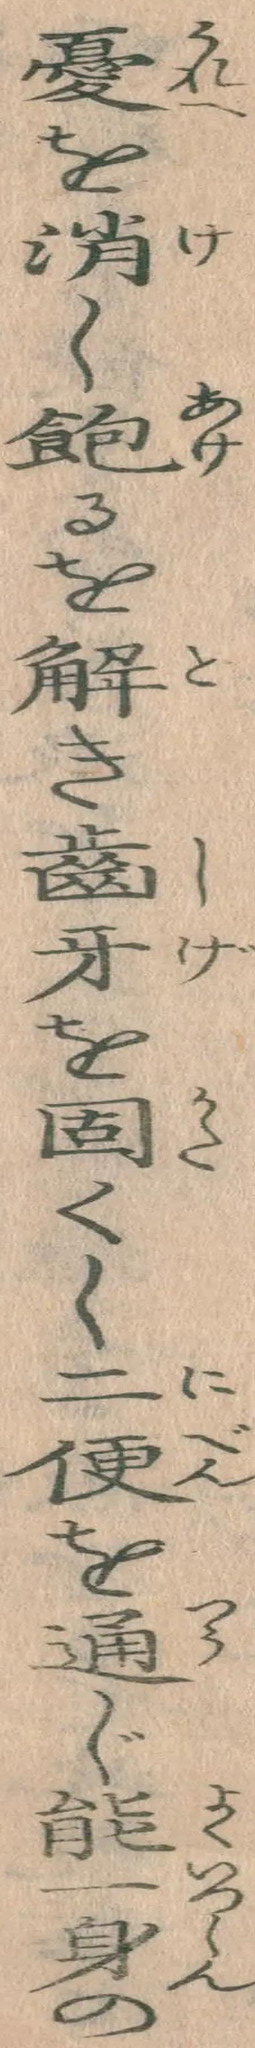憂を消し飽るを解き歯牙を固くし二便を通じ能一身の
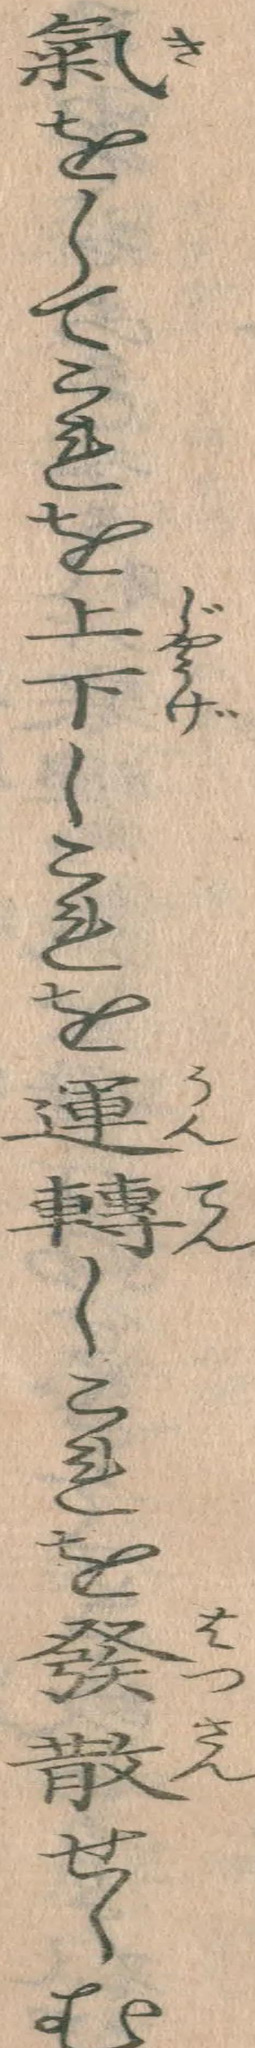気をしてこれを上下しこれを運転しこれを発散せしむ
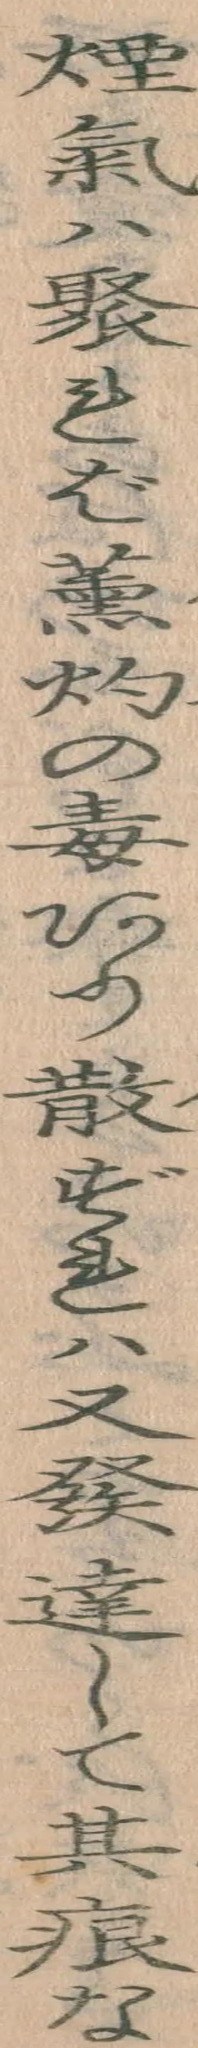煙気は聚れば薫灼の毒あり散ずれは又発達して其痕な
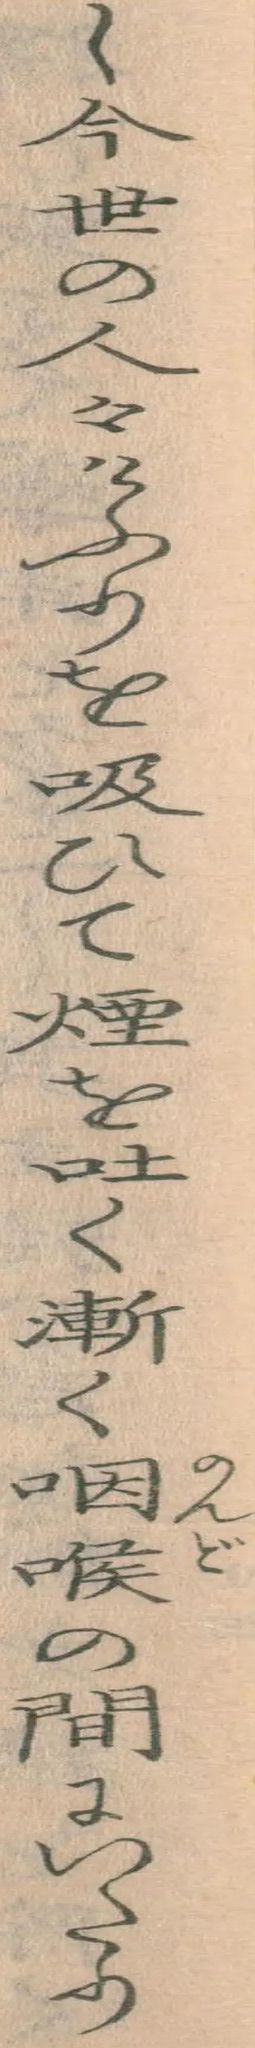し今世の人々けふりを吸ひて煙を吐く漸く咽喉の間にいたり
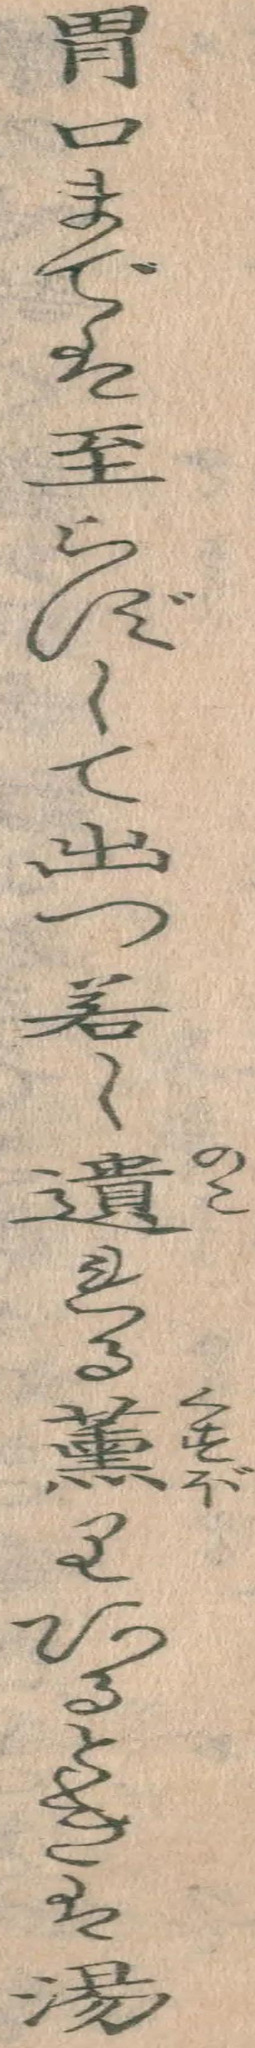胃口までは至らずして出つ若し遺れる薫りあるときは湯
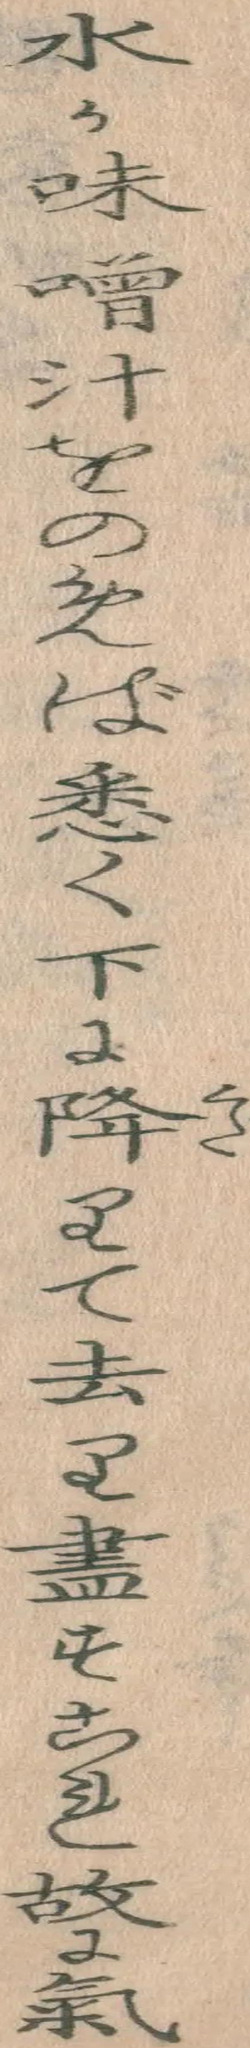水か味噌汁をのめば悉く下に降りて去り尽すこれ故に気
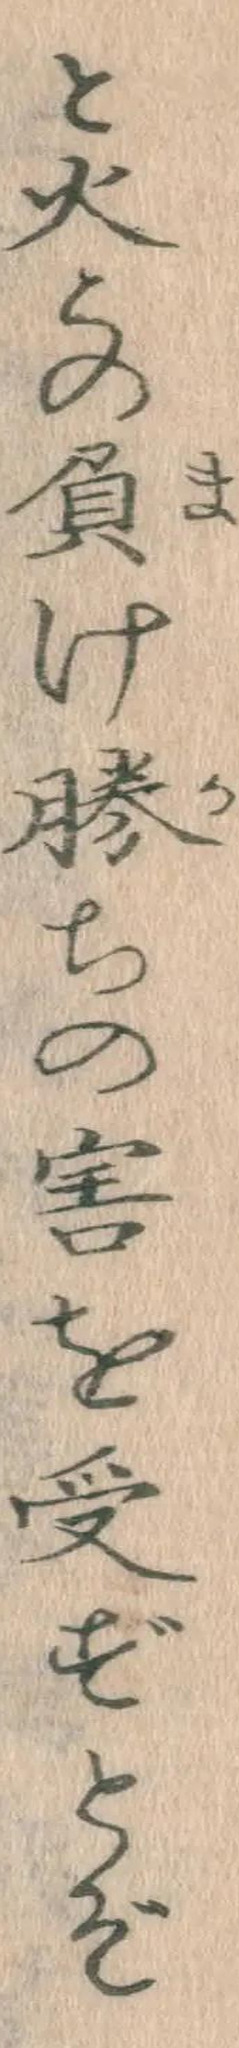と火との負け勝ちの害を受ずとぞ
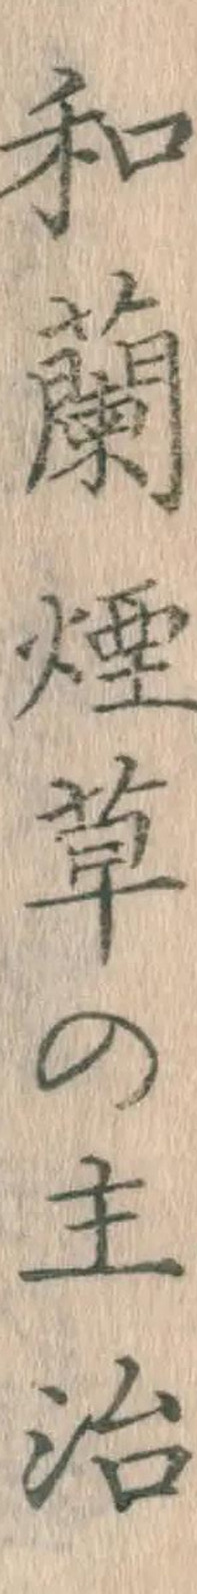和蘭煙草の主治
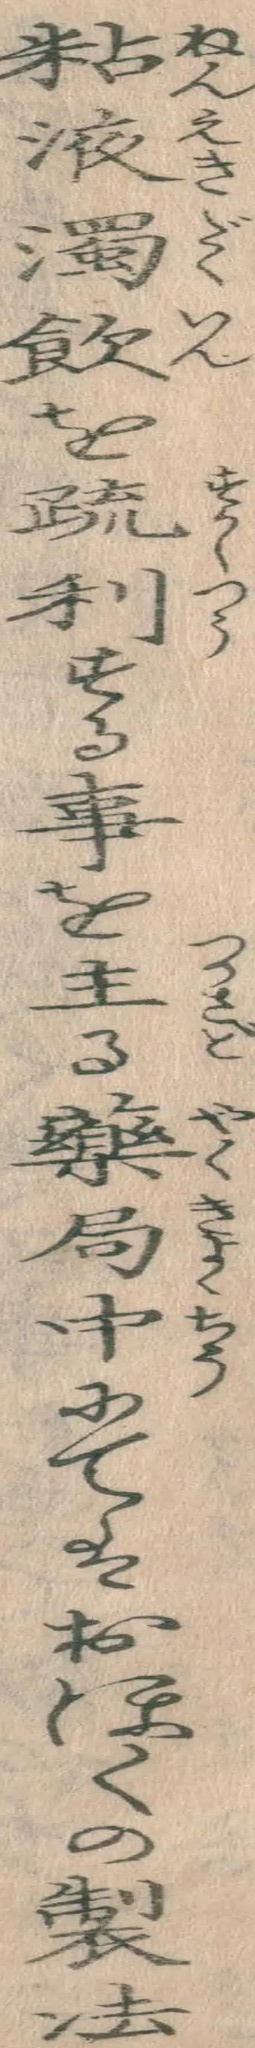粘液濁飲を疏利する事を主る薬局中にてはおほくの製法
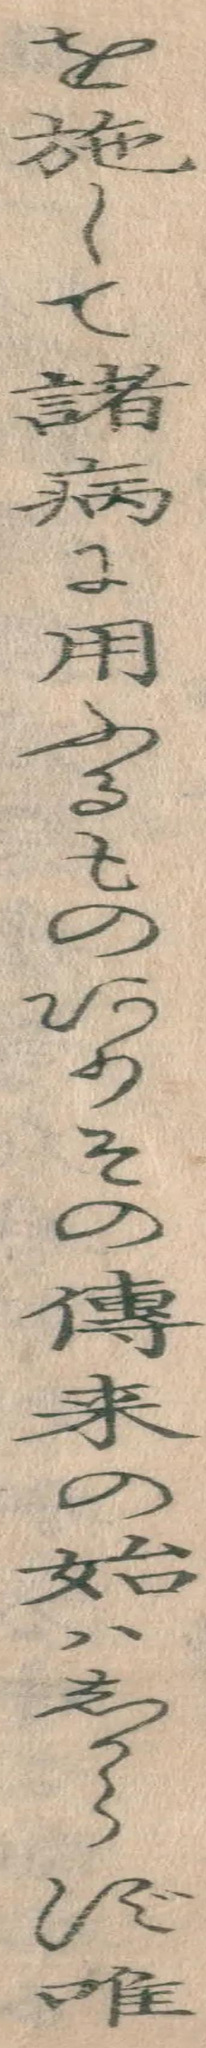を施して諸病に用ふるものありその伝来の始はしからず唯
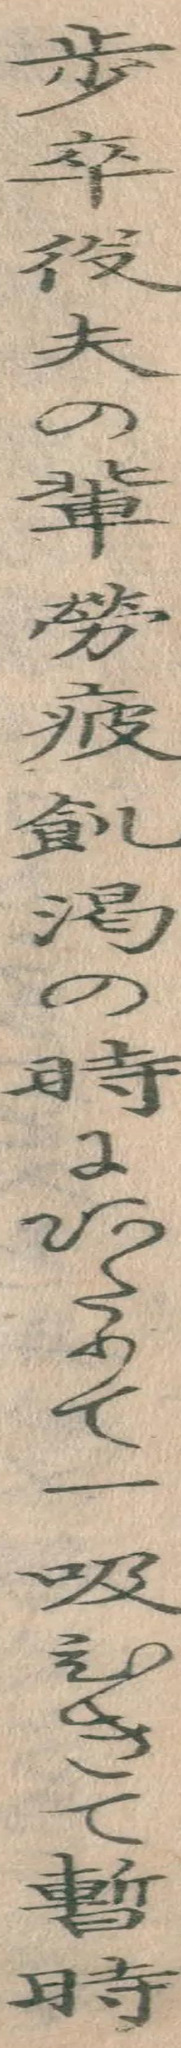歩卒役夫の輩労疲飢渇の時にあたりて一吸ひきて暫時
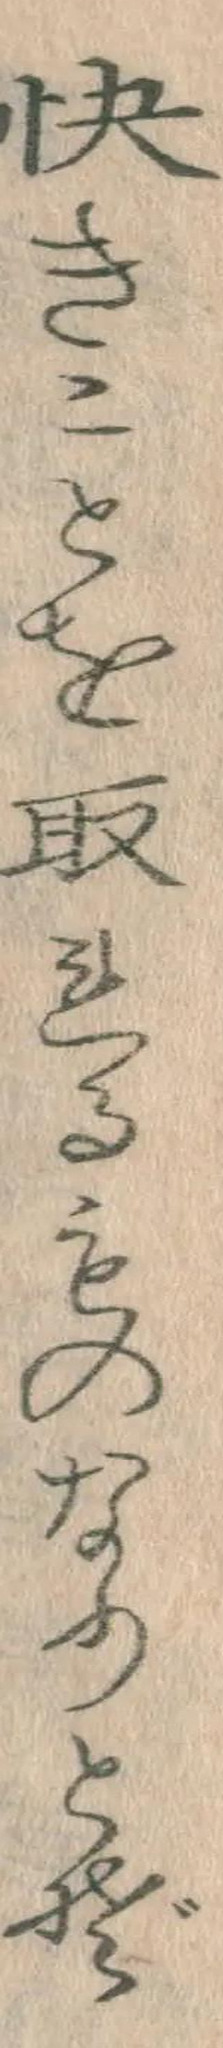快きことを取れるものなりとぞ

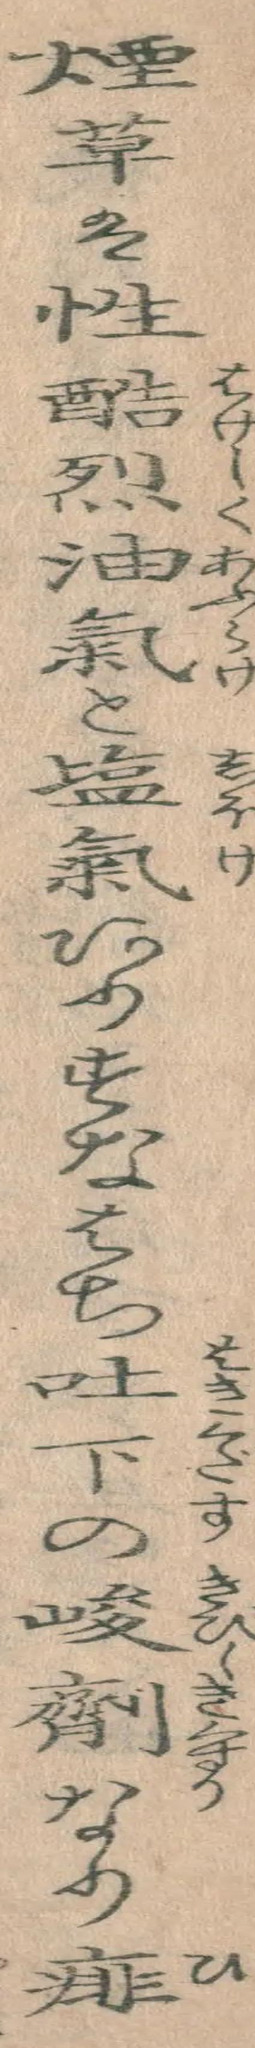煙草は性酷烈油気と塩気ありすなはち吐下の峻剤なり痱
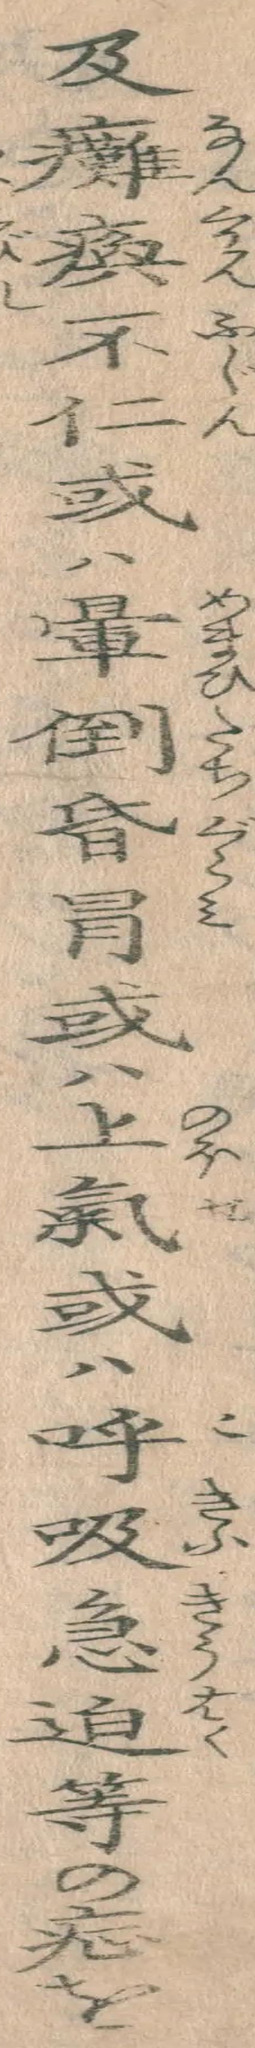及癱瘓不仁或は暈倒昏冐或は上気或は呼吸急迫等の症を
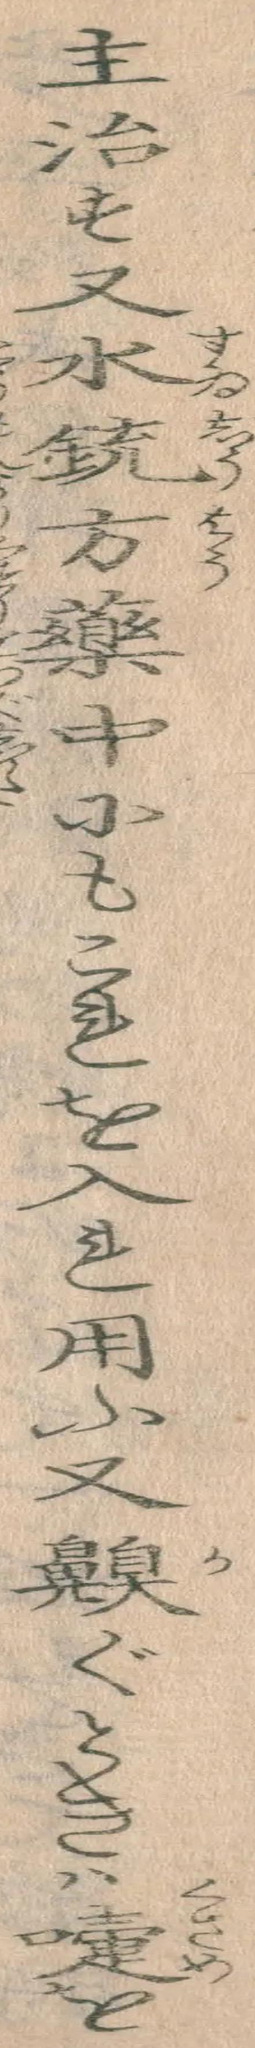主治す又水銃方薬中にもこれを入れ用ふ又嗅ぐときは嚔を
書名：目さまし草
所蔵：国立国会図書館 National Diet Library, JAPAN
